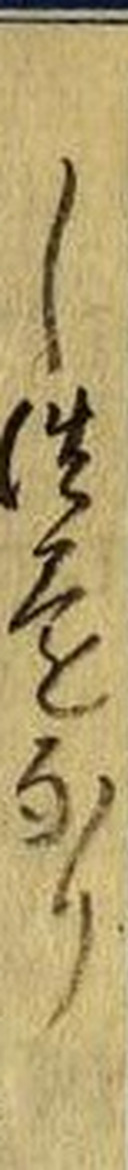し往還なり
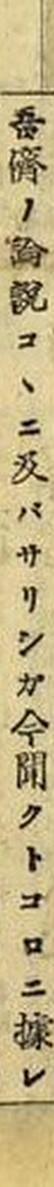吾儕ノ論説コヽニ及バサリシガ今聞クトコロニ據レ
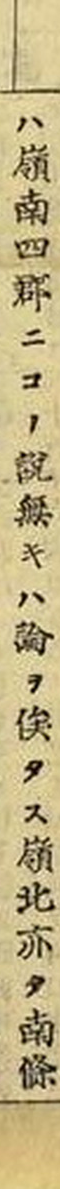ハ嶺南四郡ニコノ説無キハ論ヲ俟タス嶺北亦タ南條
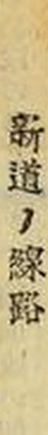新道ノ線路
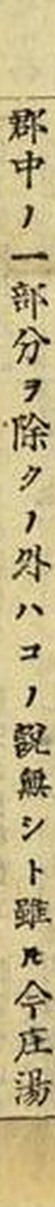郡中ノ一部分ヲ除クノ外ハコノ説無シト雖𪜈今庄湯
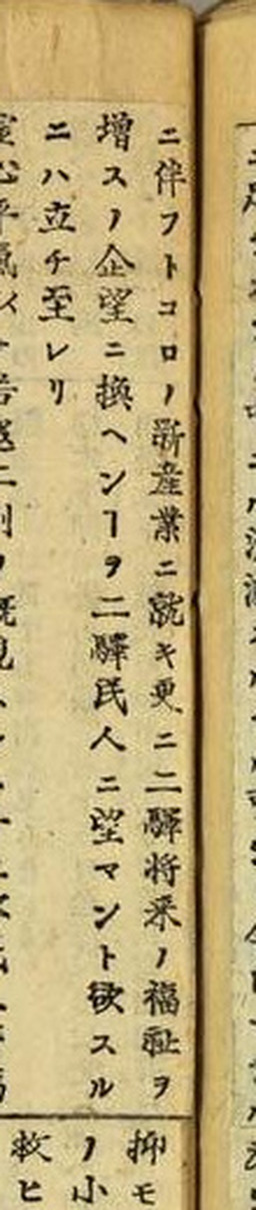増スノ企望ニ換ヘンヿヲ二驛民人ニ望マント欲スル
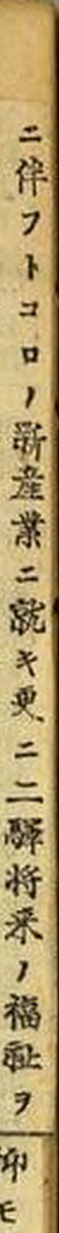ニ伴フトコロノ新産業ニ就キ更ニ二驛將來ノ福祉ヲ
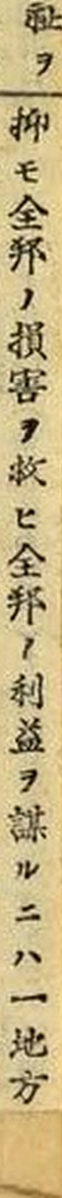抑モ全邦ノ損害ヲ救ヒ全邦ノ利益ヲ謀ルニハ一地方
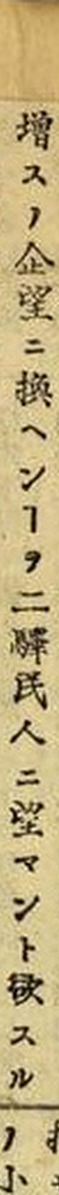増スノ企望ニ換ヘンヿヲ二驛民人ニ望マント欲スル
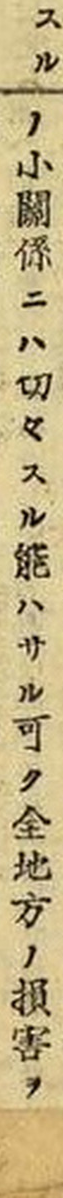ノ小關係ニハ切々スル能ハサル可ク全地方ノ損害ヲ
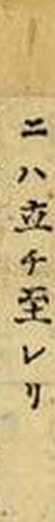ニハ立チ至レリ
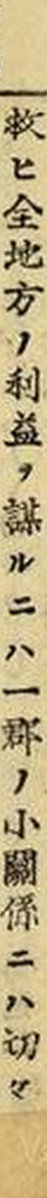救ヒ全地方ノ利益ヲ謀ルニハ一郡ノ小關係ニハ切々
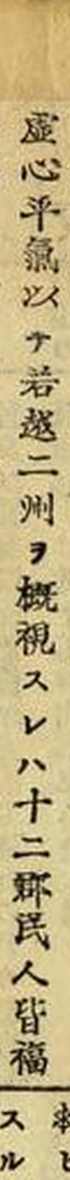虚心平氣以テ若越二州ヲ概視スレハ十二郡民人皆福
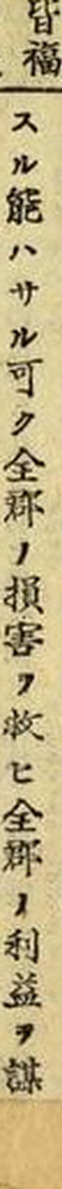スル能ハサル可ク全郡ノ損害ヲ救ヒ全郡ノ利益ヲ謀
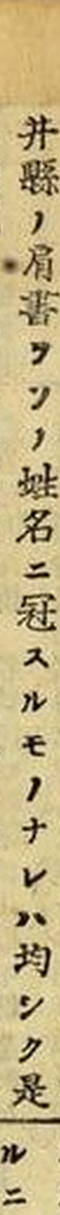井縣ノ肩書ヲソノ姓名ニ冠スルモノナレハ均シク是
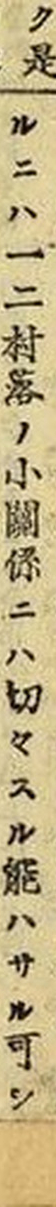ルニハ一二村落ノ小關係ニハ切々スル能ハサル可シ
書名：温古集 五巻
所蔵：福井県文書館 Fukui Prefectural Archives
